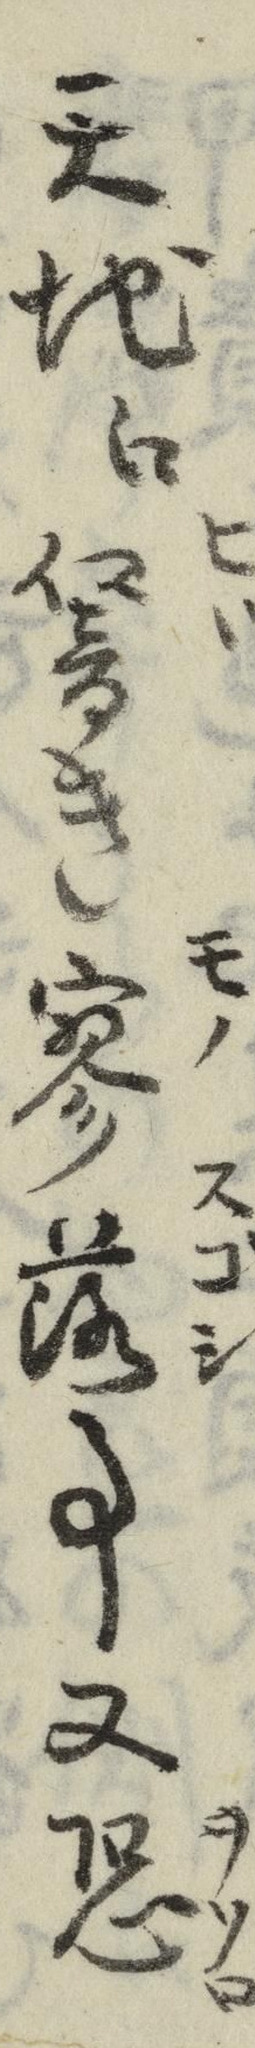天地え響き寥落事又恐
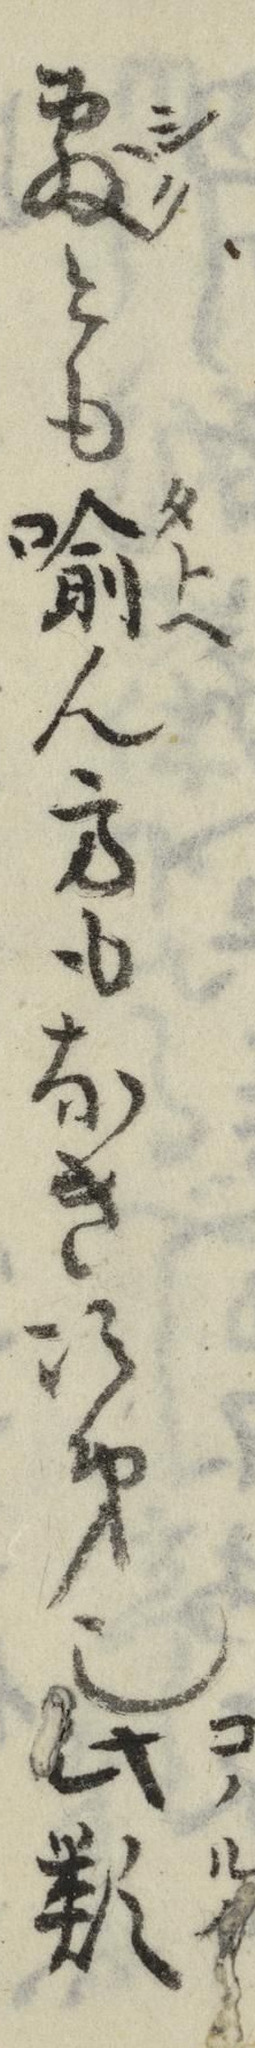敷とも喩ん方もなき次第也此類
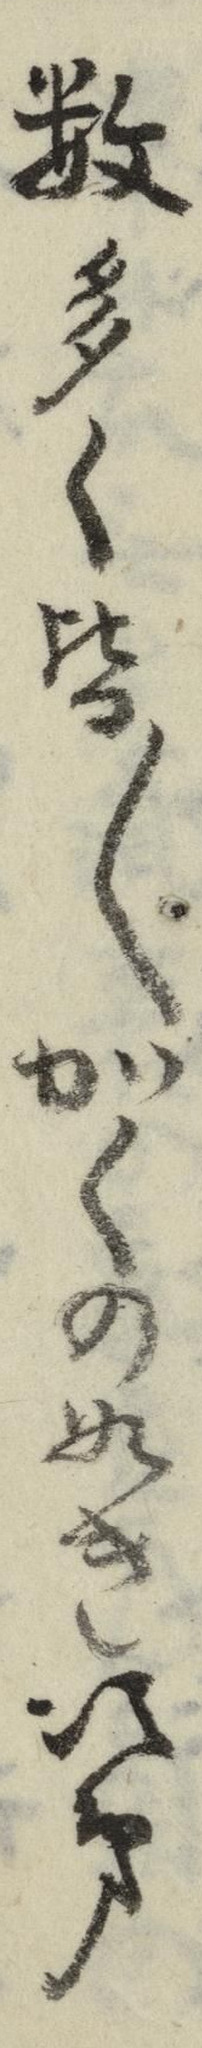数多く皆〳〵かくの如き次第
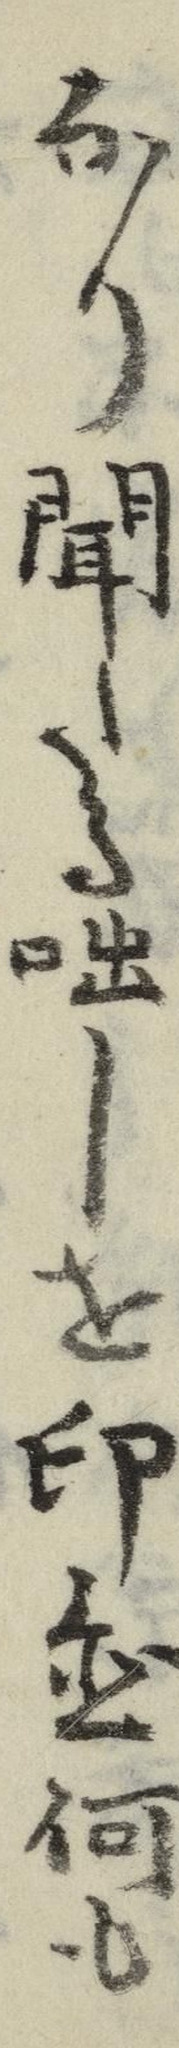なり聞たる咄しを印置何も
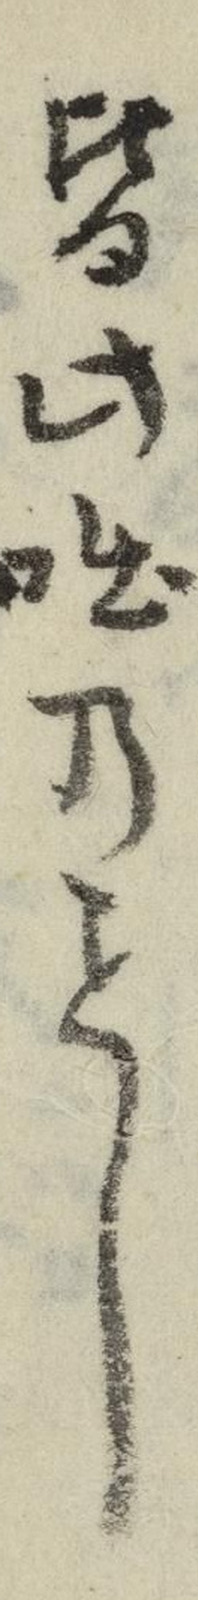皆此咄乃ことし
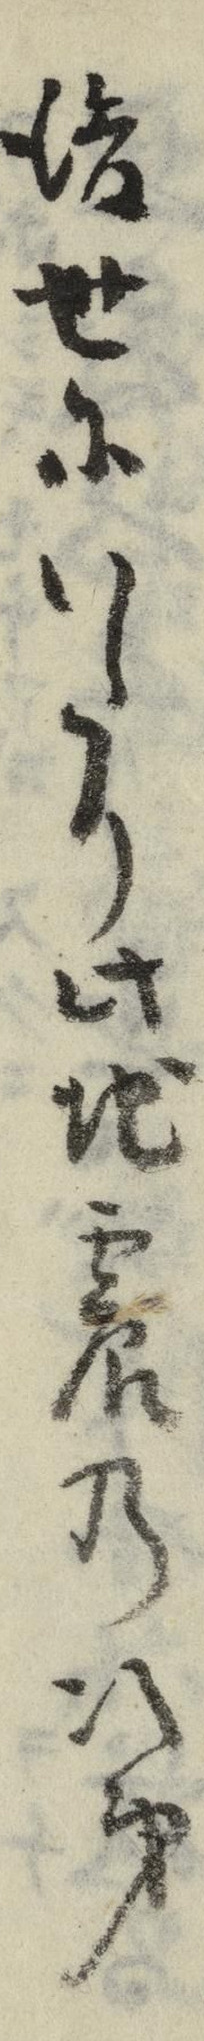後世にいたり此地震乃次第

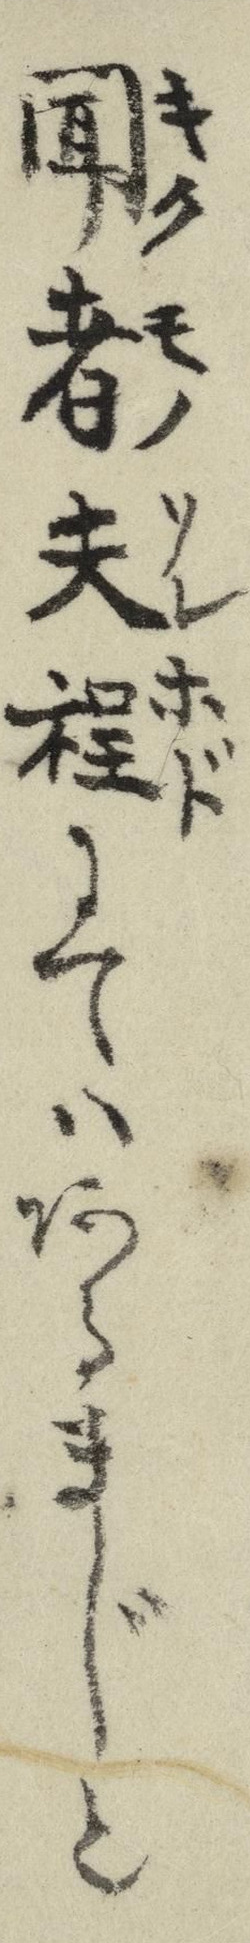聞者夫程にてあるまじと
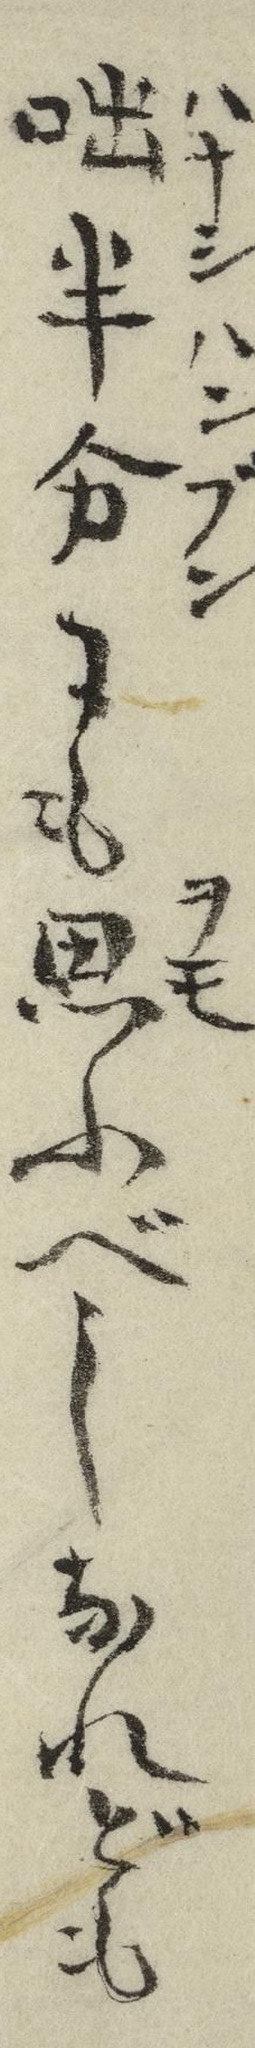咄半分にも思ふべしなれど
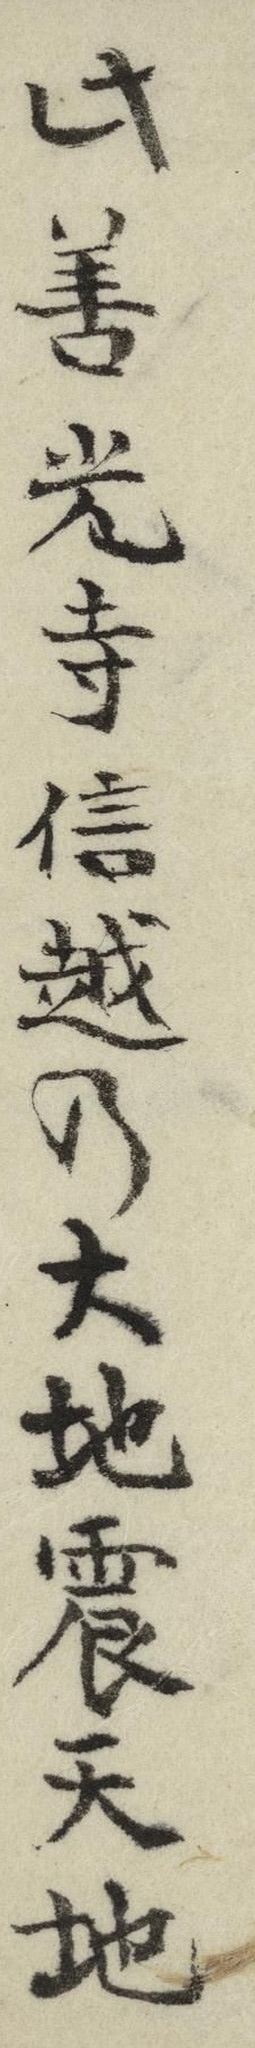此善光寺信越乃大地震天地
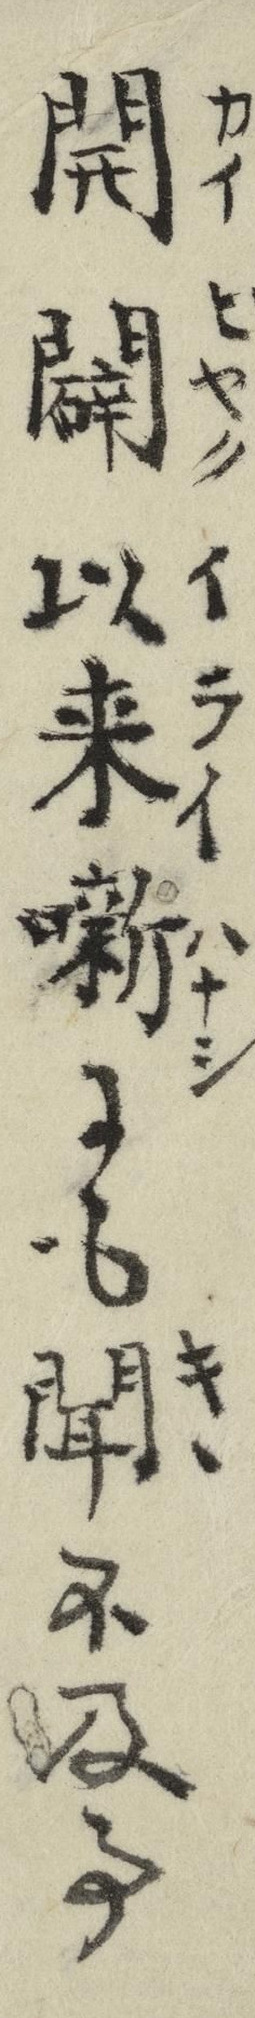開闢以来噺にも聞不及事
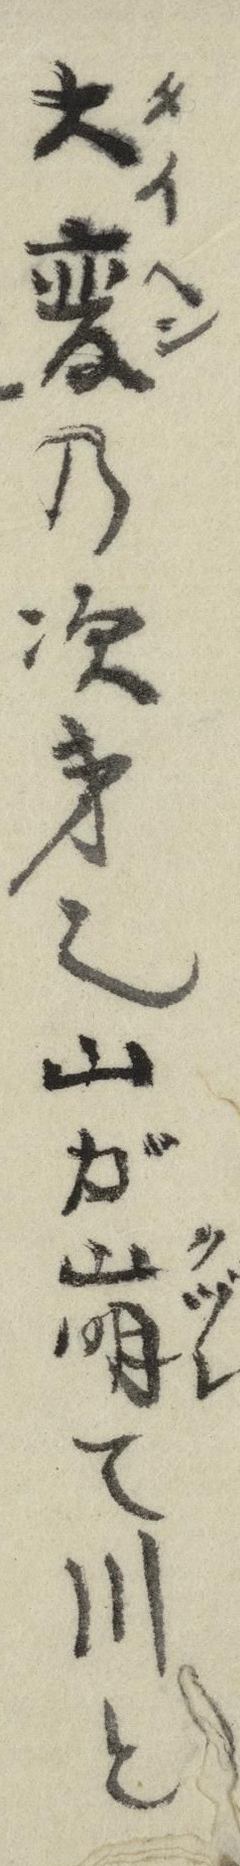大変乃次第也山が崩て川と
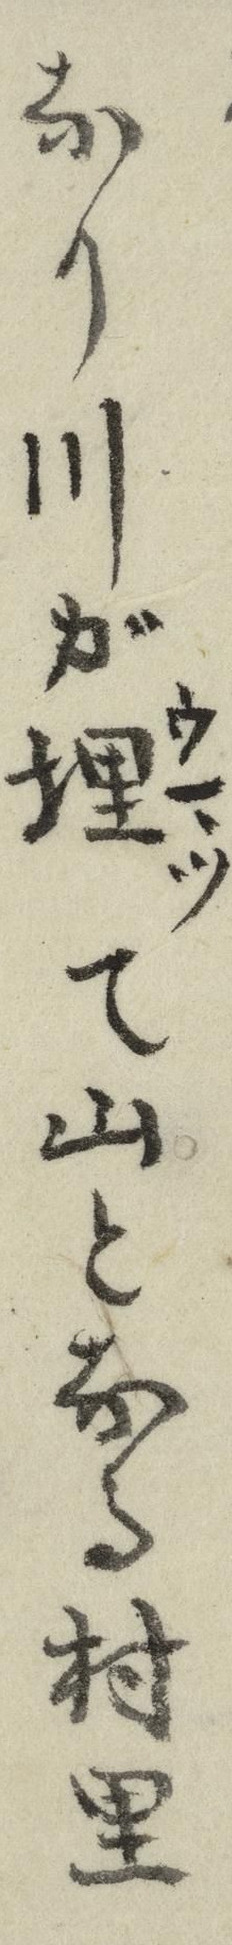なり川が埋て山となる村里
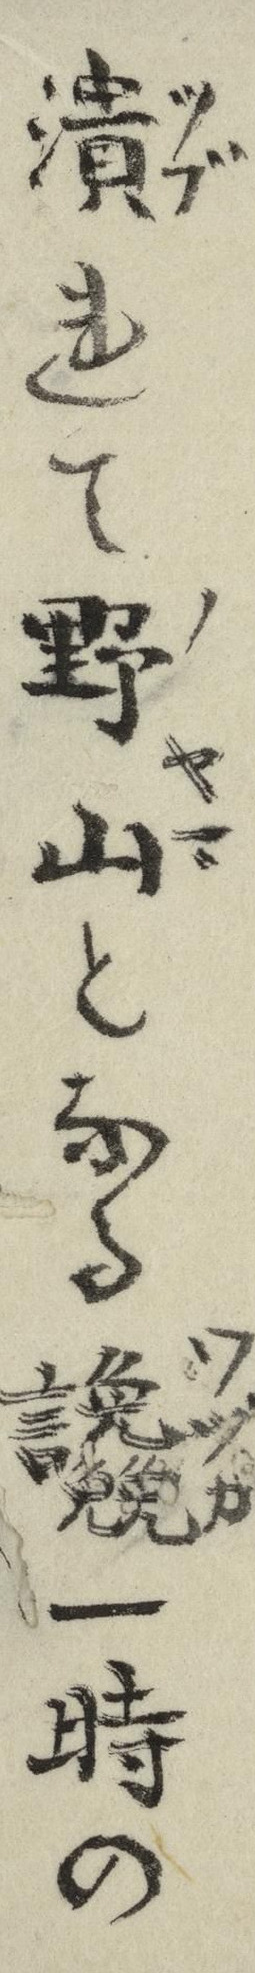潰れて野山となる纔一時の
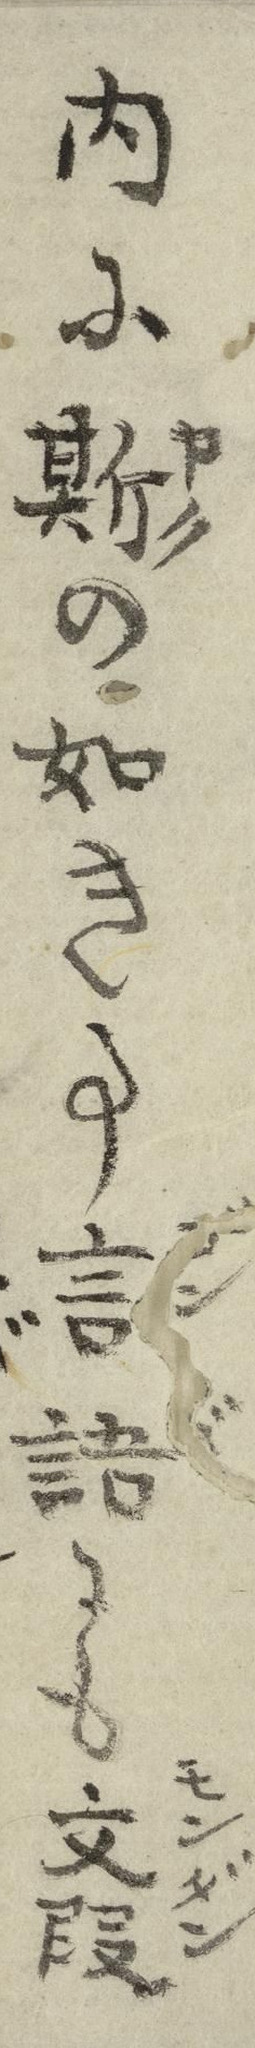内に斯の如き事言語にも文段
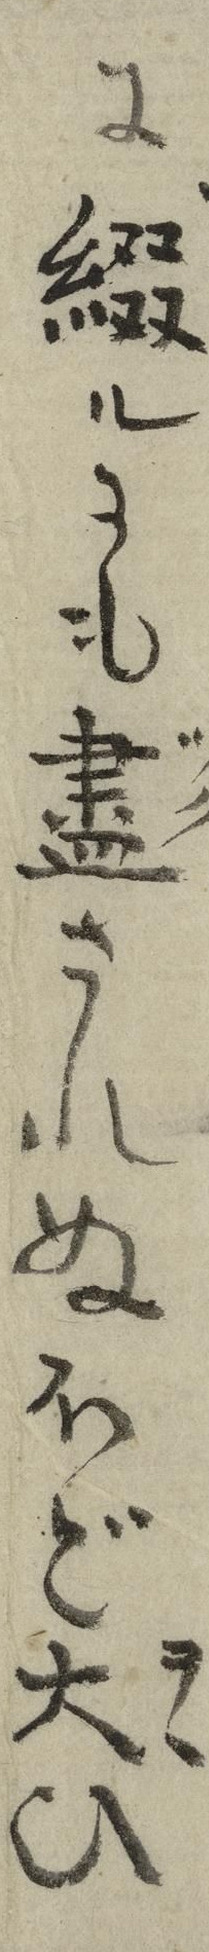に綴ㇽにも盡されぬほど大ひ
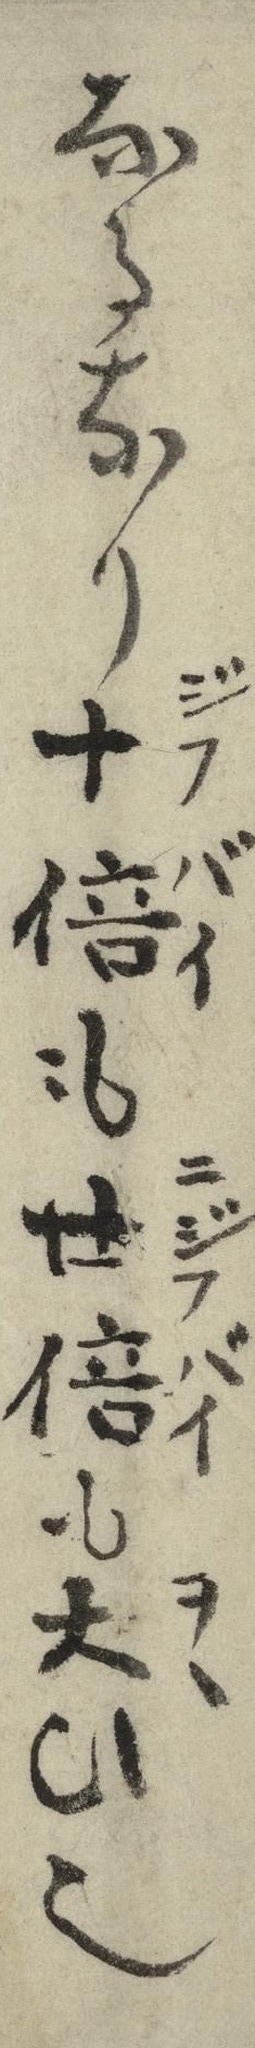なるなり十倍も廿倍も大ひ也
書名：信州大地震一件之冩　丁未弘化四年三月吉日
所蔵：東京大学地震研究所図書室 Earthquake Research Institute Library, The University of Tokyo, JAPAN
